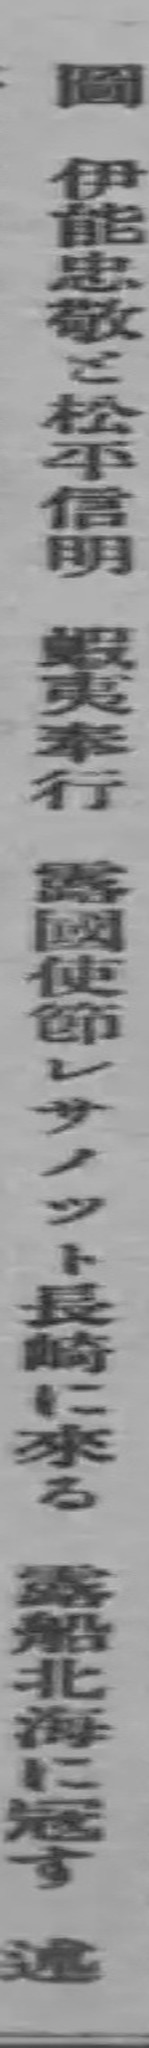図伊能忠敬と松平信明蝦夷奉行露国使節レサノツト長崎に来る露船北海に冠す述
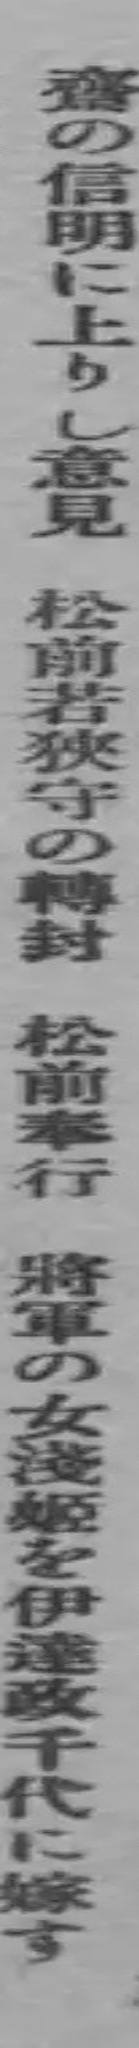斉の信明に上りし意見松前若狭守の転封松前奉行将軍の女浅姫を伊達政千代に嫁す
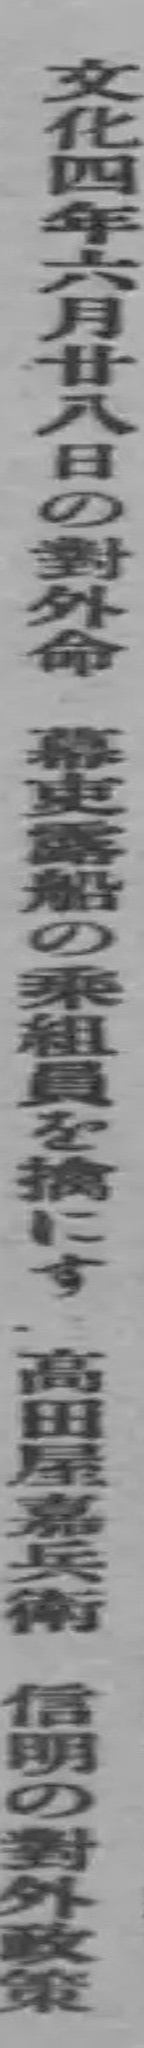文化四年六月廿八日の対外命幕吏露船の乗組員を擒にす高田屋嘉兵衛信明の対外政策
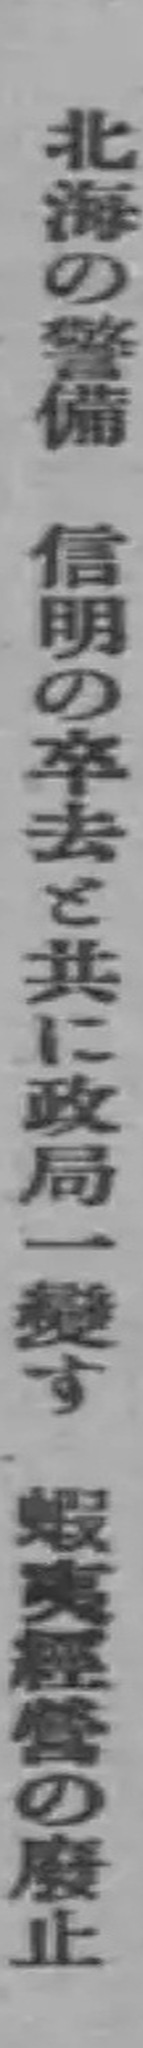北海の警備信明の卒去と共に政局一変す蝦夷経営の廃止
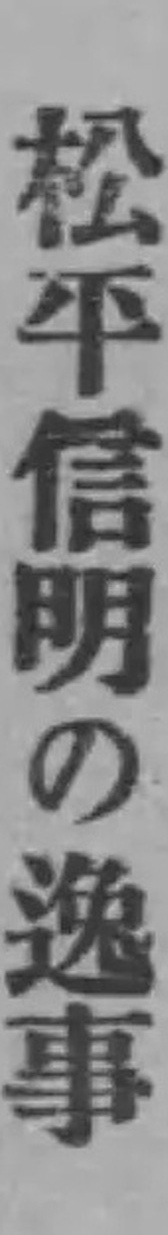松平信明の逸事
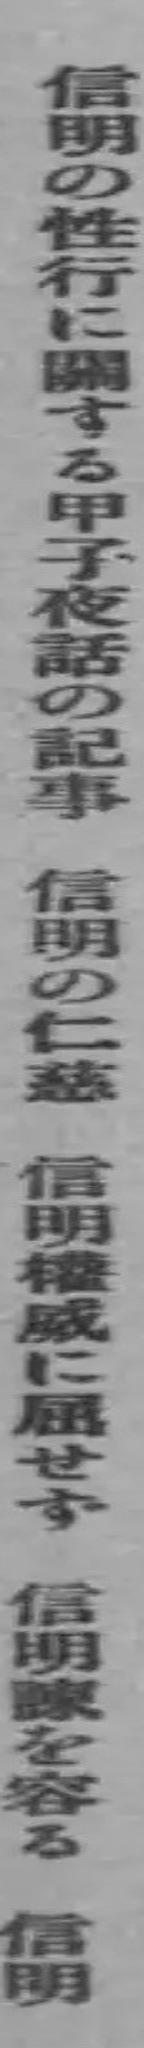信明の性行に関する甲子夜話の記事信明の仁慈信明権威に屈せず信明諫を容る信明
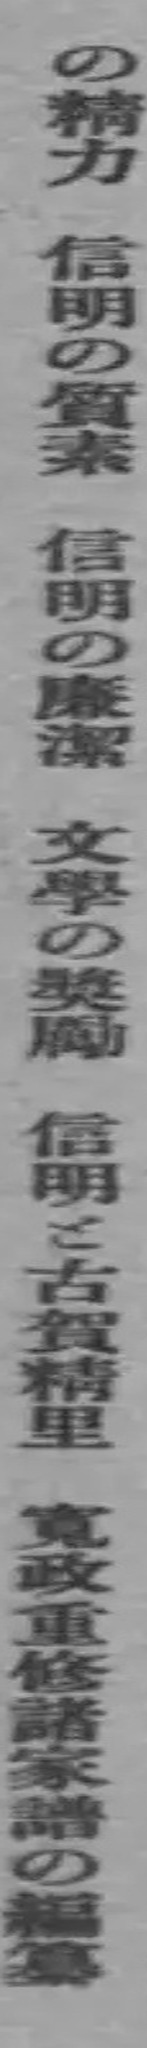の精力信明の質素信明の廉潔文学の奨励信明と古賀精里寛政重諸家譜の編纂

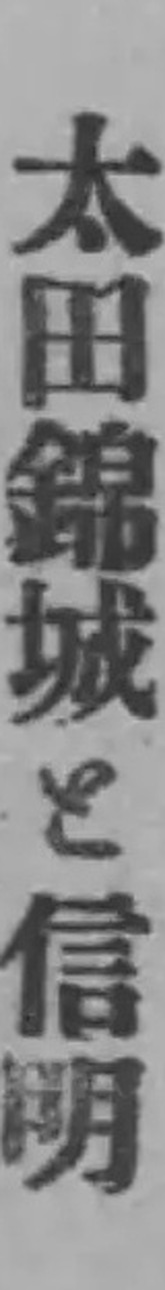太田錦城と信明
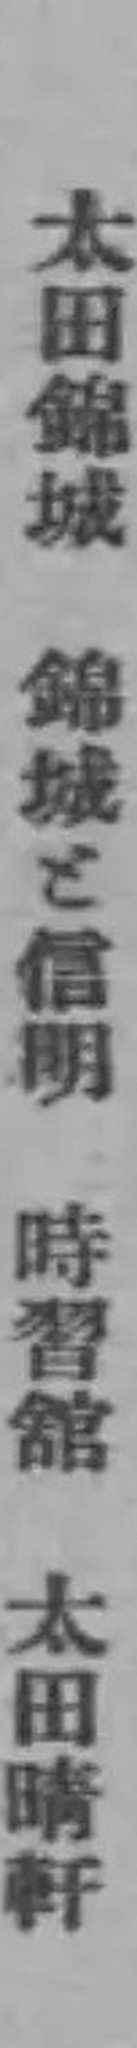太田錦城錦城と信明時習館太田晴軒
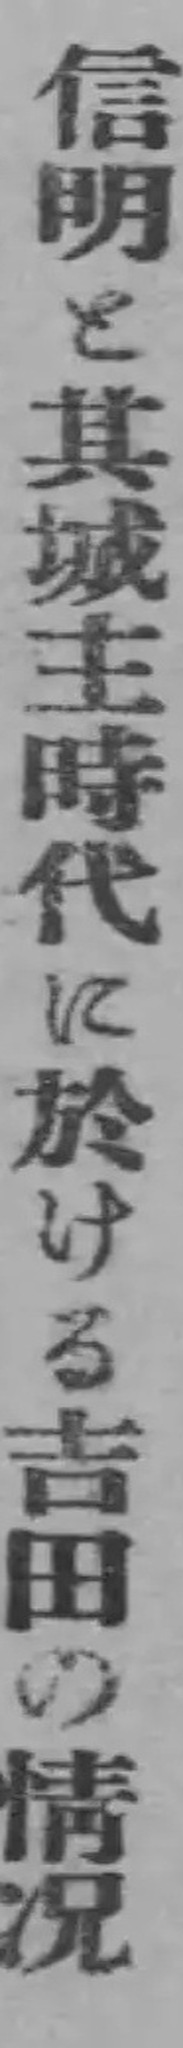信明と其城主時代に於ける吉田の情況
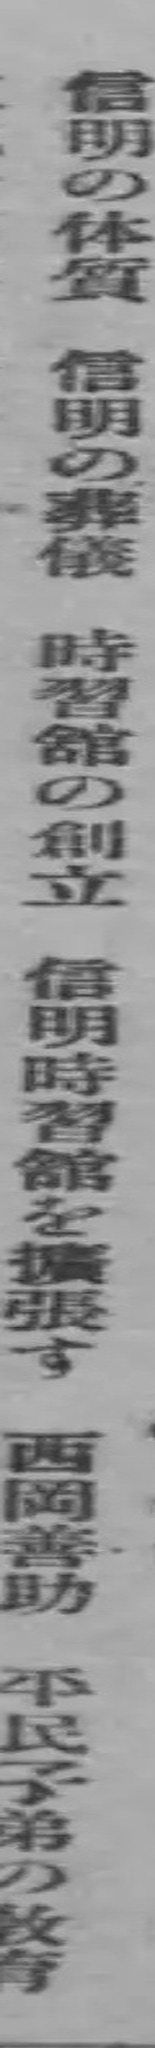信明の体質信明の葬儀時習館の創立信明時習館を拡張す西岡善助平民子弟の教育
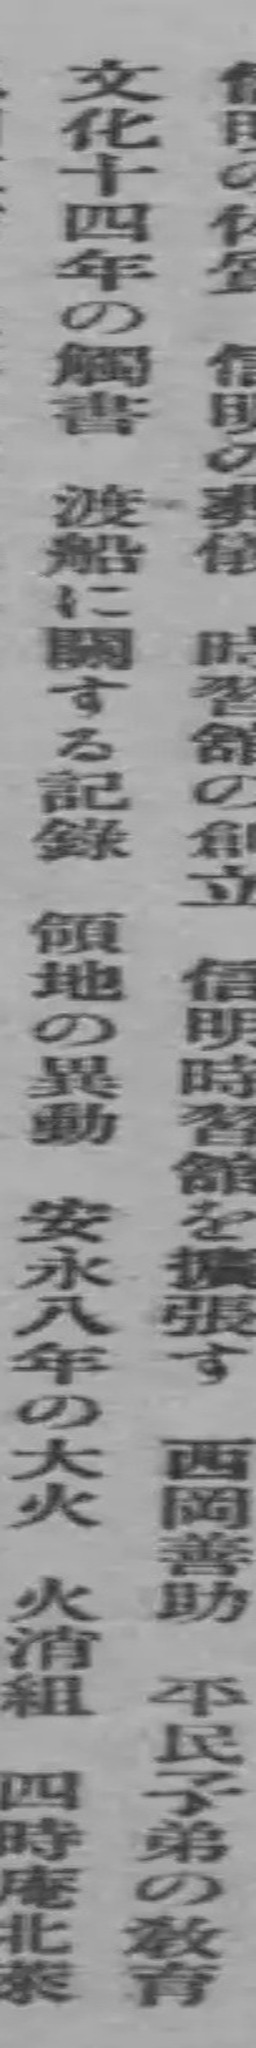文化十四年の触書渡船に関する記録領地の異動安永八年の大火火消組四時庵北莱
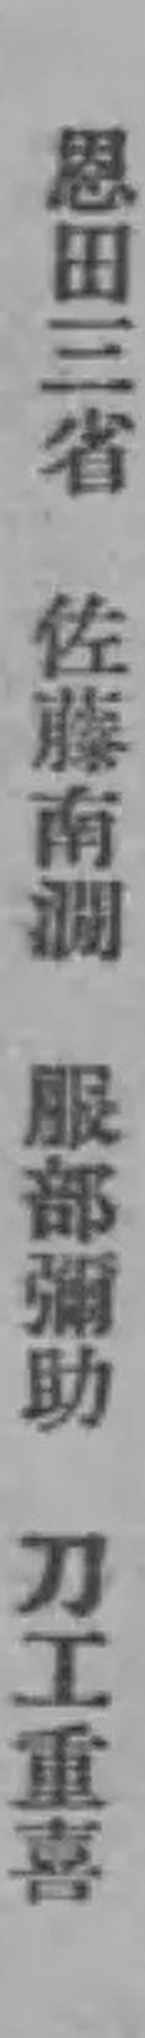恩田三省佐藤南澗服部弥助刀工重喜
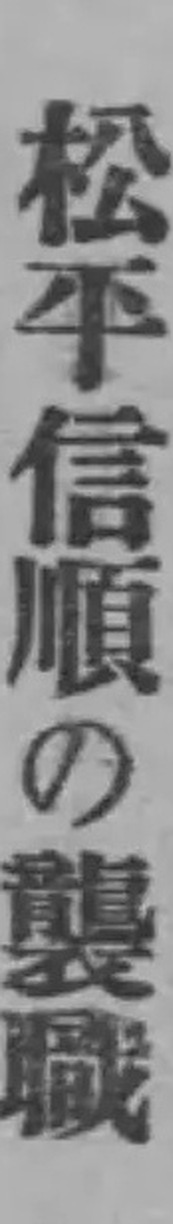松平信順の襲職
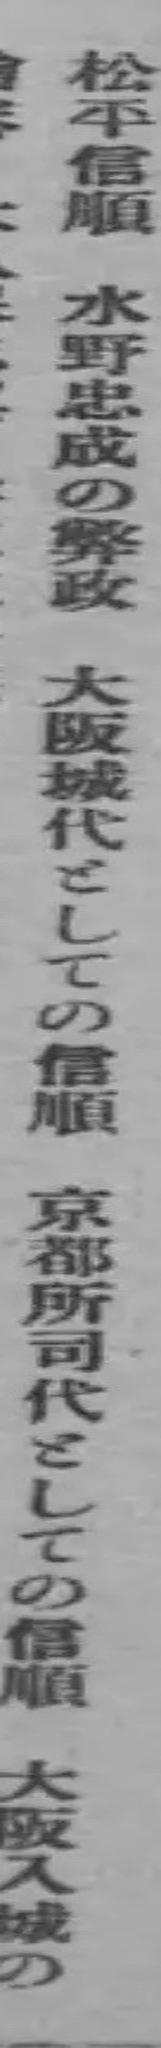松平信順水野忠成の弊政大阪城代としての信順京都所司代としての信順大阪入城の
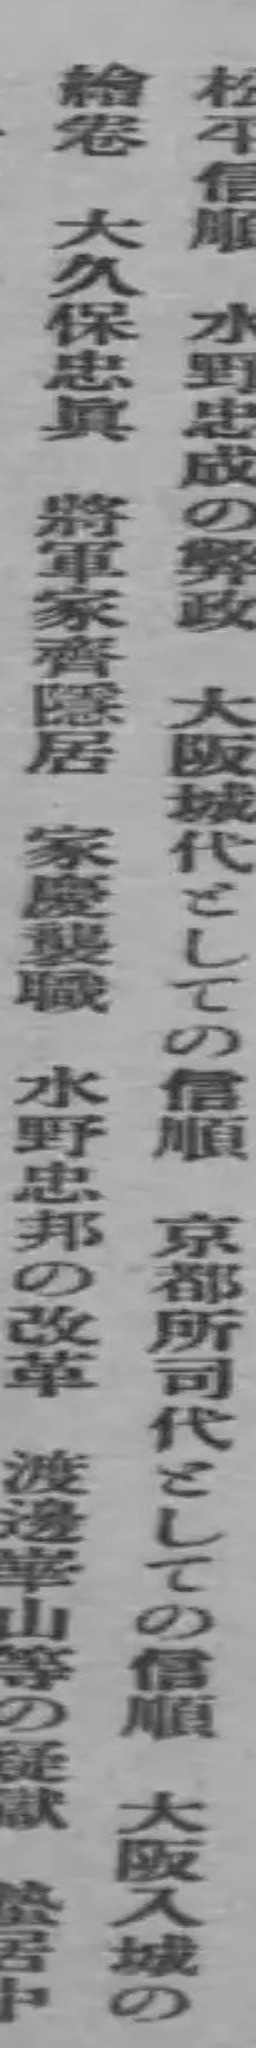絵巻大久保忠眞将軍家斉隠居家慶襲職水野忠邦の改革渡邉崋山等の疑獄蟄居中
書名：豊橋市史談
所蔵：国立国会図書館 National Diet Library, JAPAN
